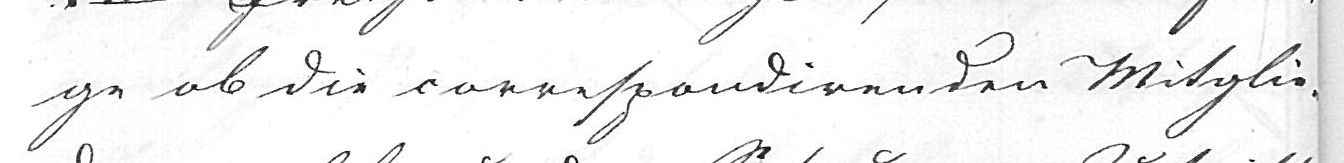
ge ob die correspondirenden Mitglie-
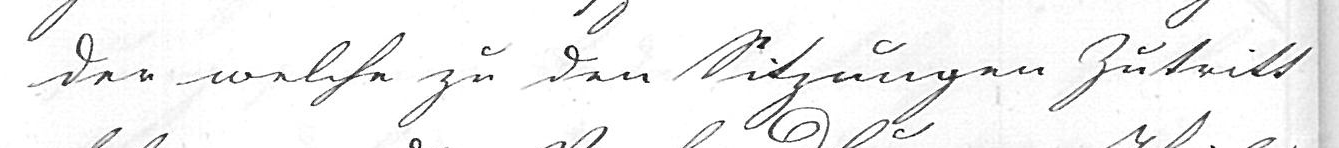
der welche zu den Sitzungen Zutritt
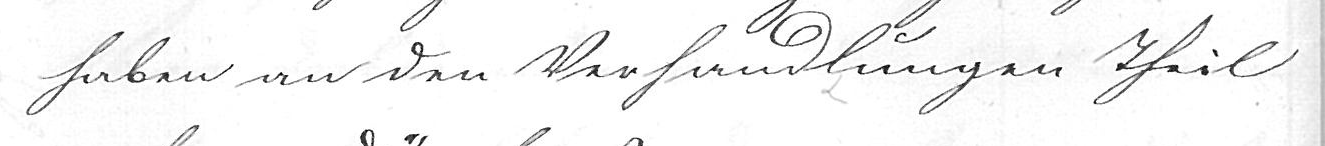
haben an den Verhandlungen Theil
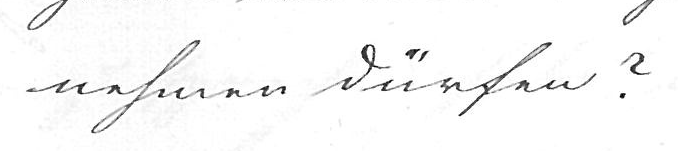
nehmen dürfen?
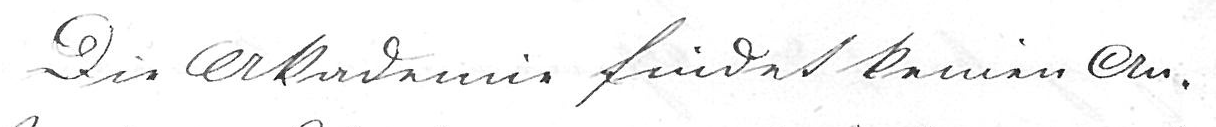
Die Akademie findet keinen An-
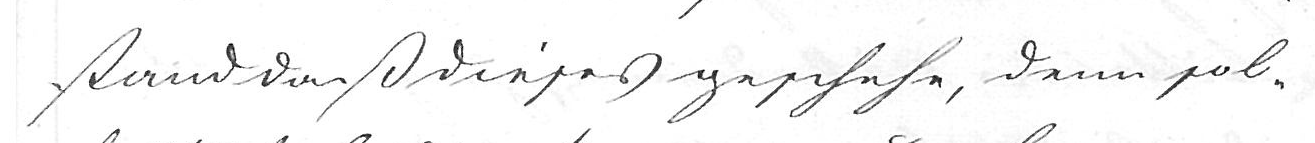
stand daß dieses geschehe, denn sol-
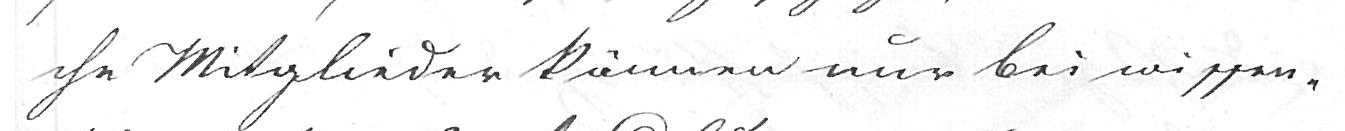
che Mitglieder können nur bei wissen-
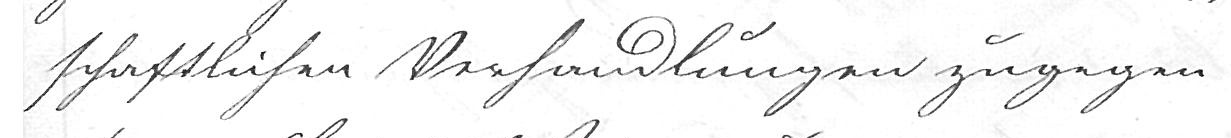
schaftlichen Verhandlungen zugegen
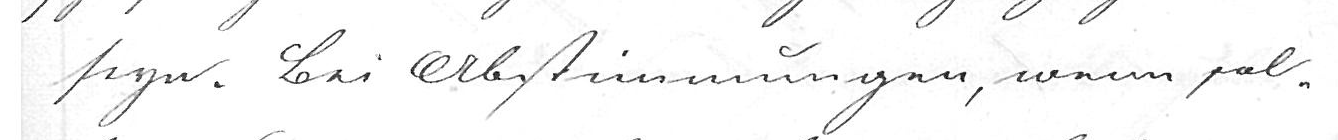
seyn. Bei Abstimmungen, wenn sol-
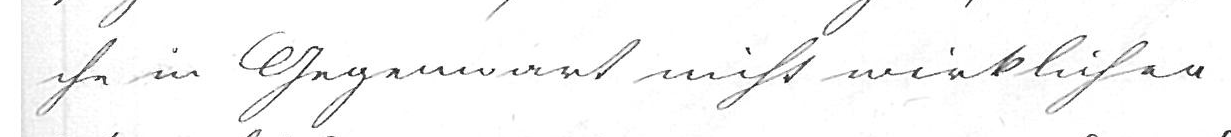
che in Gegenwart nicht wirklicher
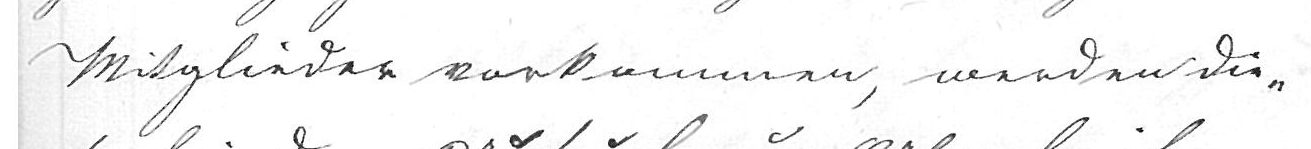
Mitglieder vorkommen, werden die-
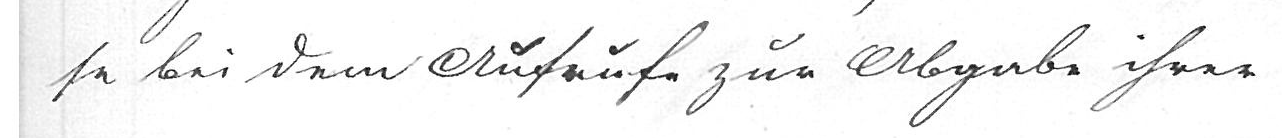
se bei dem Aufrufe zur Angabe ihrer
